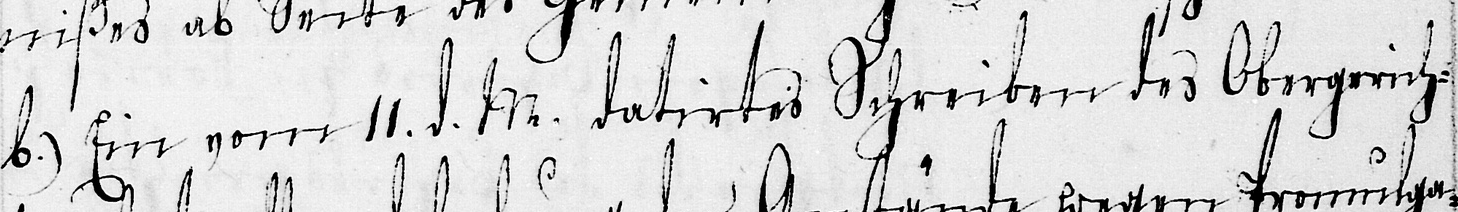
b.) Ein vom 11. d. M. datirtes Schreiben des Obergerich¬
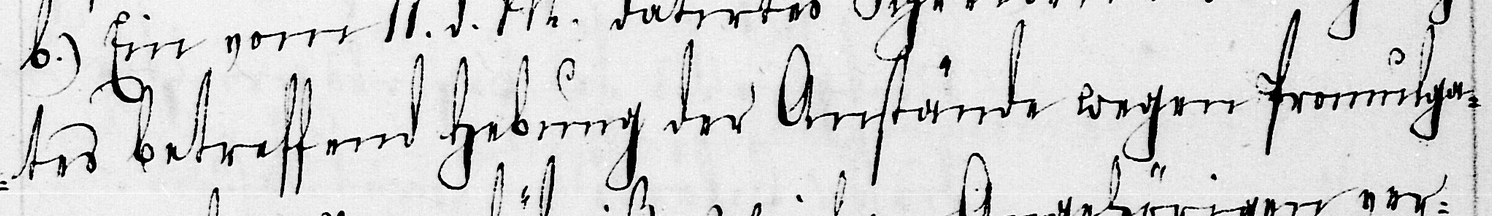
tes betreffend Hebung der Anstände wegen Promulga¬
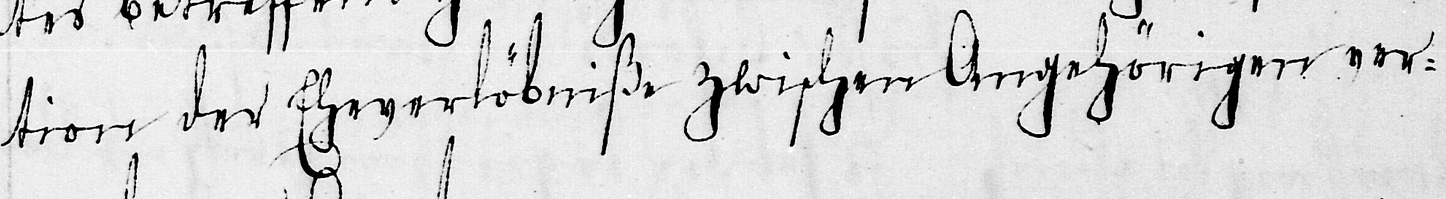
tion der Eheverlöbniße zwischen Angehörigen ver¬
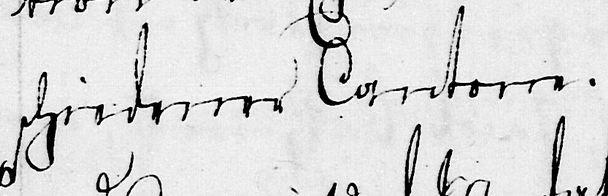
schiedener Cantone.
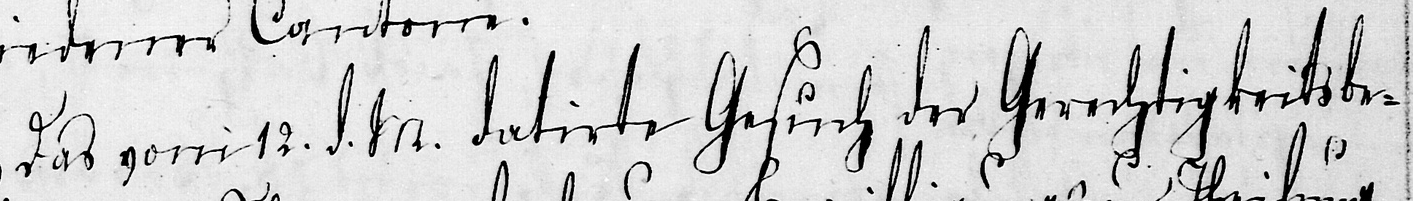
Das vom 12. d. M. datirte Gesuch der Gerechtigkeitsbe¬
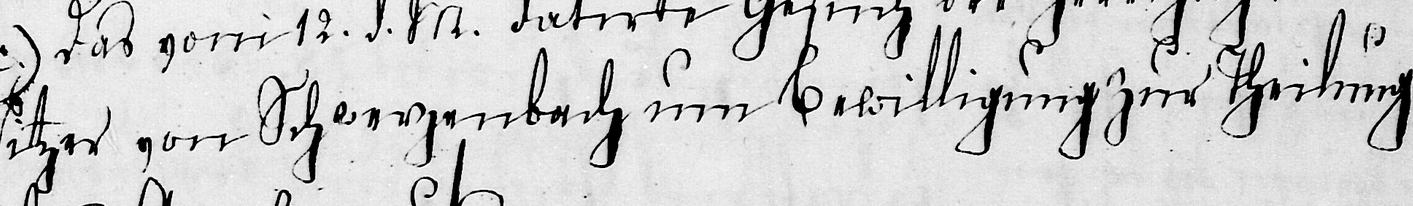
sitzer von Schwerzenbach um Bewilligung zur Theilung
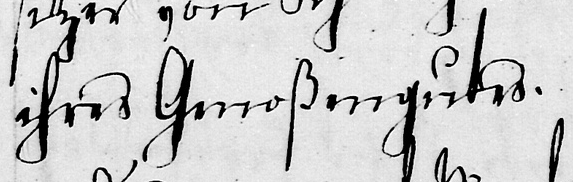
ihres Genoßengutes.
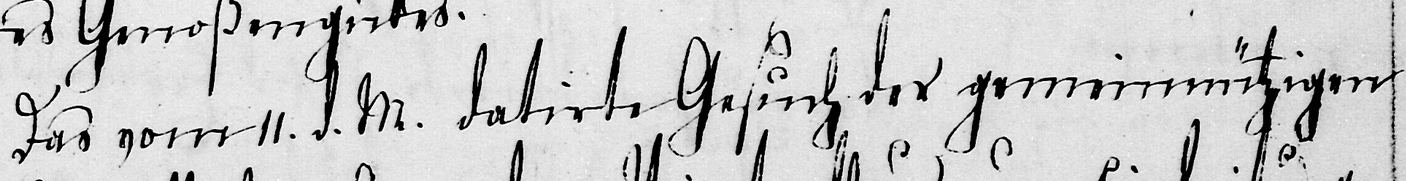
Das vom 11. d. M. datirte Gesuch der gemeinnützigen
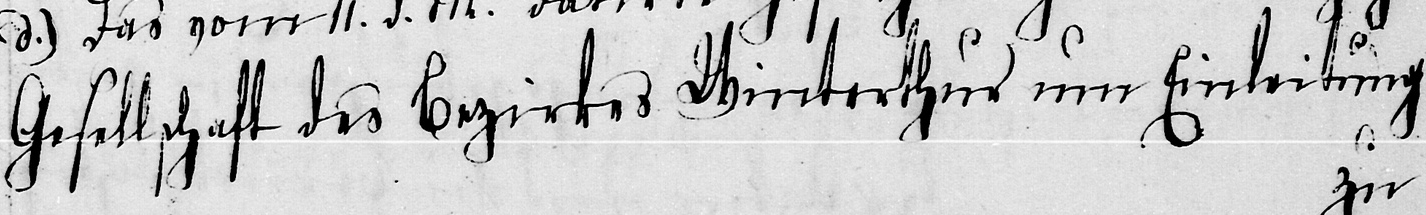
Gesellschaft des Bezirkes Winterthur um Einleitung
